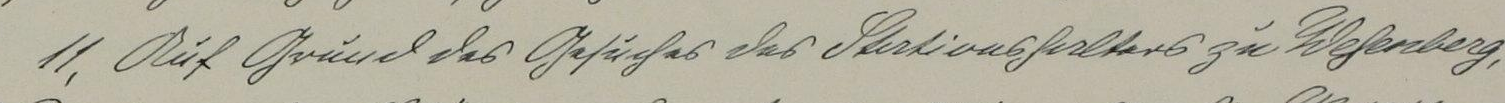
11. Auf Grund des Gesuches des Stationshalters zu Wesenberg,
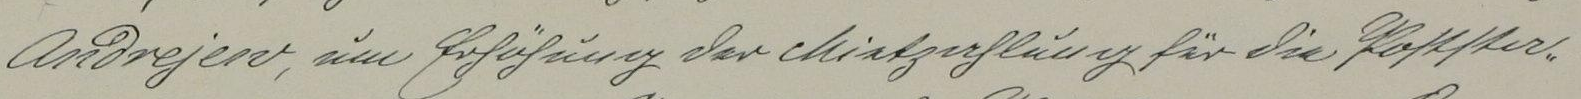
Andrejew, um Erhöhung der Mietzahlung für die Poststa-
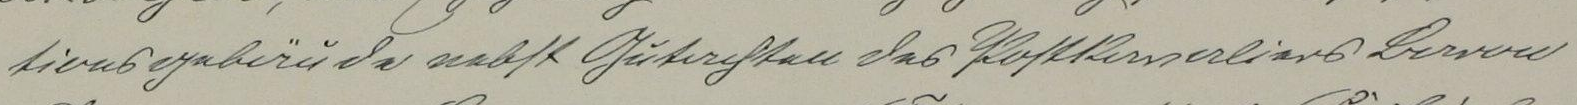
tionsgebäude nebst Gutachten des Postkavaliers Baron
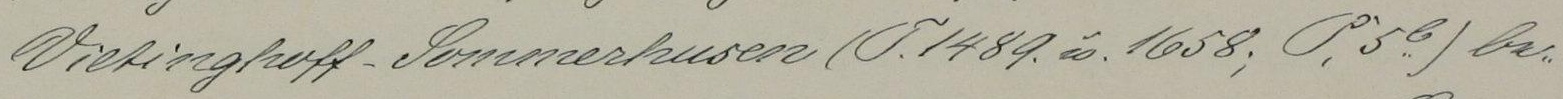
Vietinghoff-Sommerhusen (T.1489 u. 1658; P.5b) be-
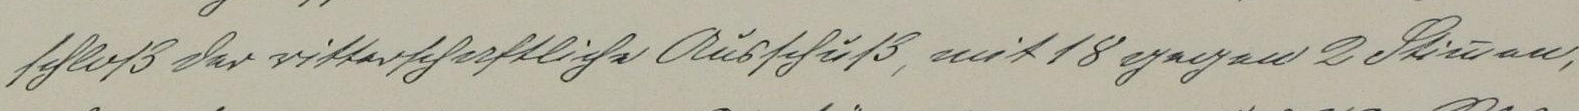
schloß der ritterschaftliche Ausschuß, mit 18 gegen 2 Stimmen,
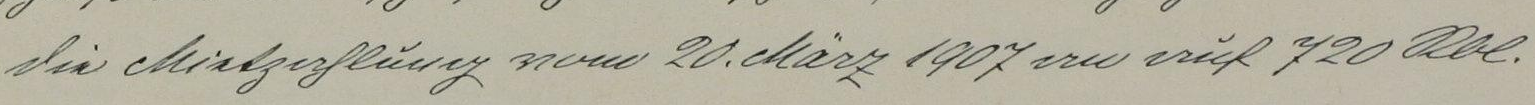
die Mietzahlung vom 20. März 1907 an auf 720 Rbl.
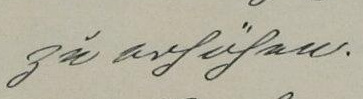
zu erhöhen.
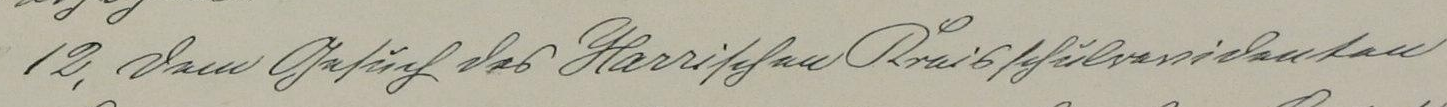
12. Dem Gesuch des Harrischen Kreisschulrevidenten
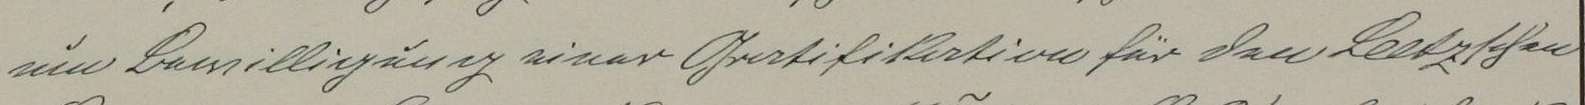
um Bewilligung einer Gratifikation für den Leetzschen
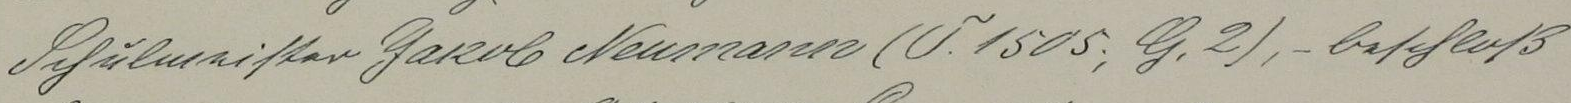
Schulmeister Jakob Neumann (T.1505; G.2) beschloß
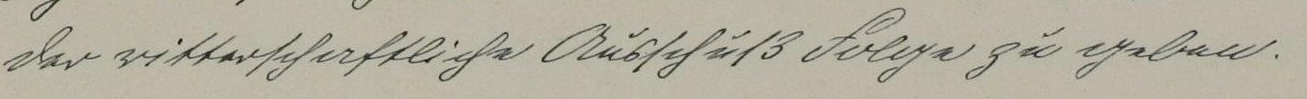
der ritterschaftliche Ausschuß Folge zu geben.
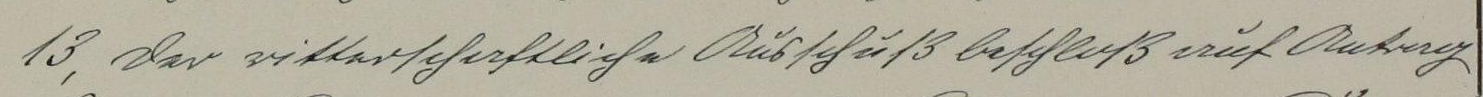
13. Der ritterschaftliche Ausschuß beschloß auf Antrag
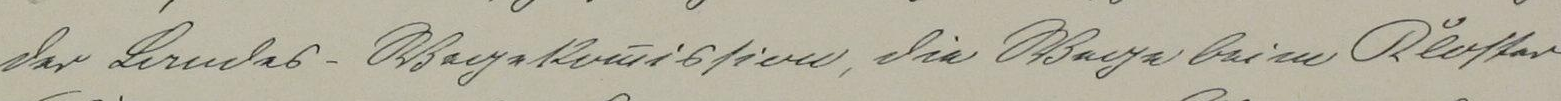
der Landes-Wegekommission, die Wege beim Kloster
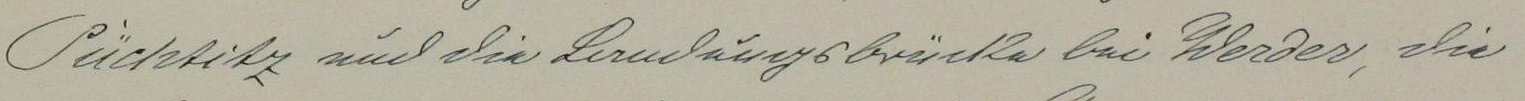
Püchtitz und die Landungsbrücke bei Werder, die
